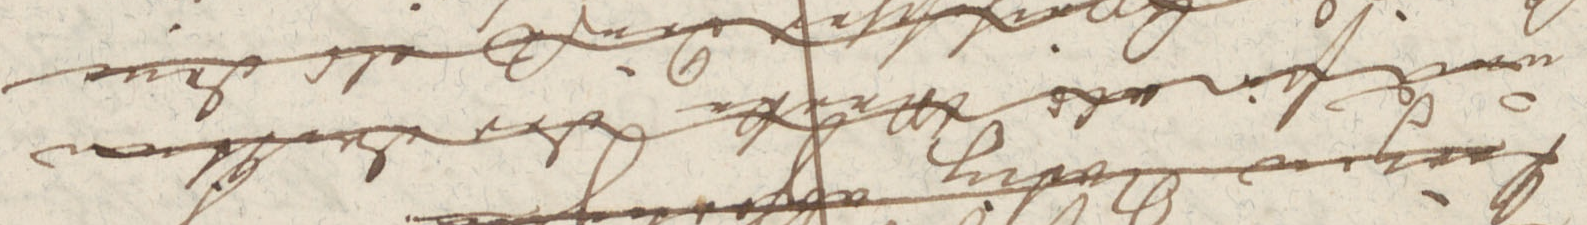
einer Zeit thätig, wie in dem eigentlichen
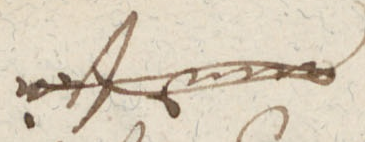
dennoch in lebendigster
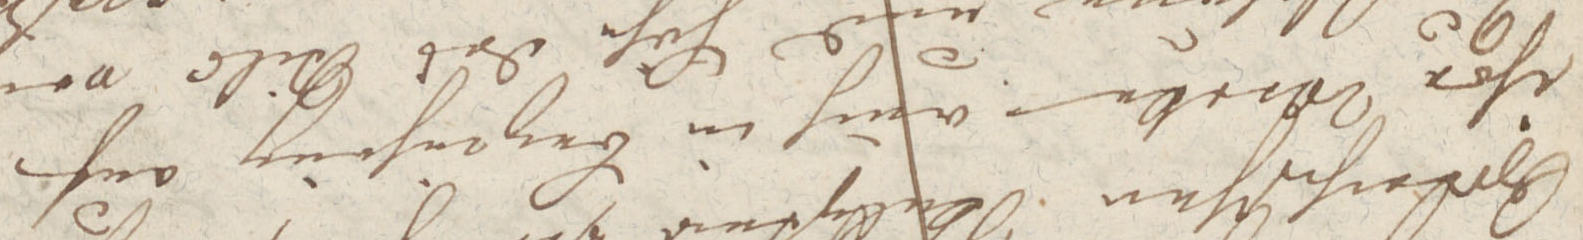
für welche unsere Handbücher
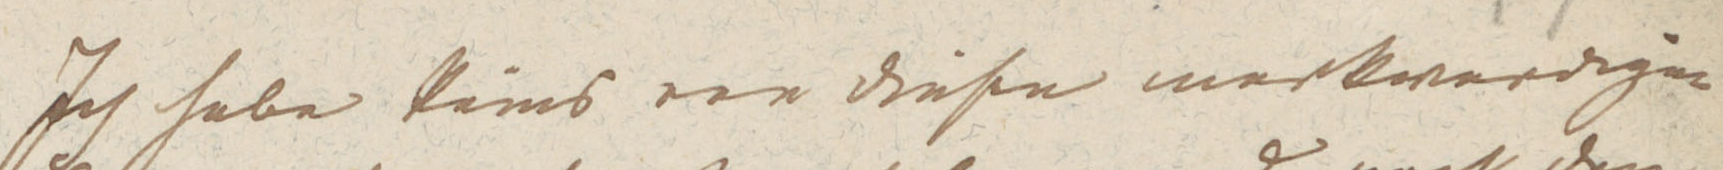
Ich habe keins von diesen merkwurdigen
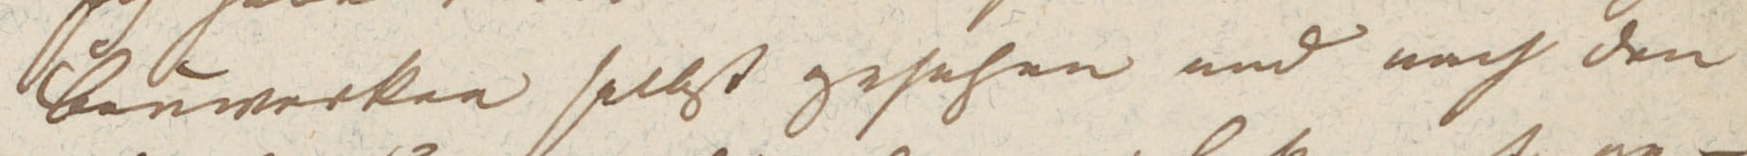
Bauwerken selbst gesehen und nach den
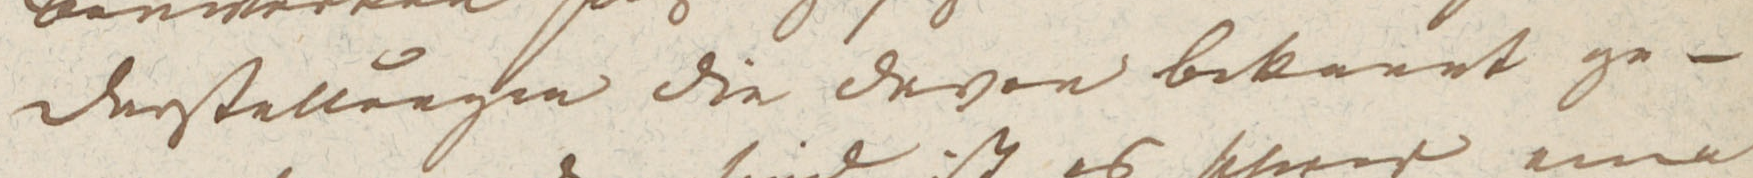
Darstellungen die davon bekannt ge-
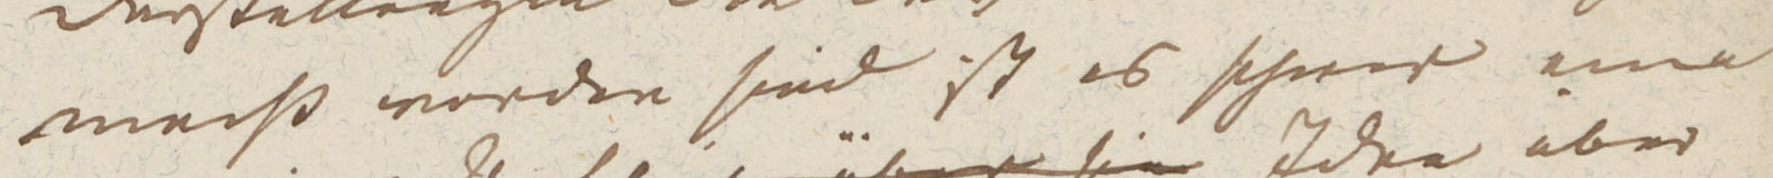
macht worden sind ist es schwer eine
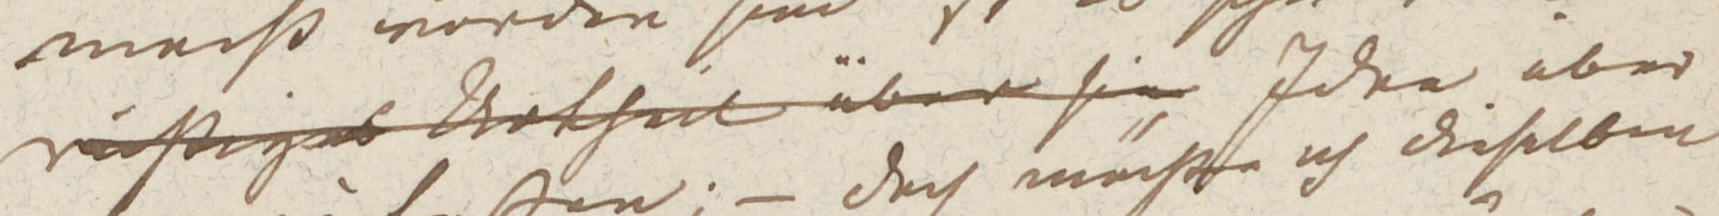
richtiges Urtheil über sie Idee über
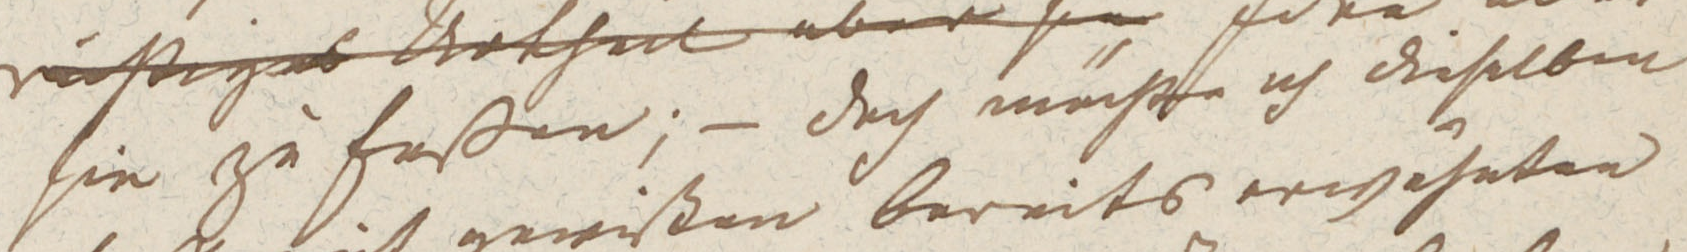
sie zu fassen; – doch möchte ich dieselben
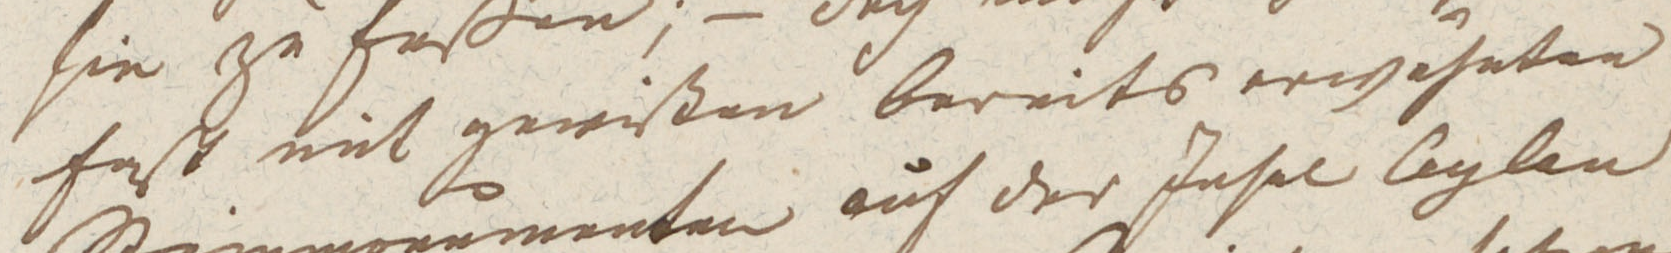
fast mit gewissen bereits erwähnten
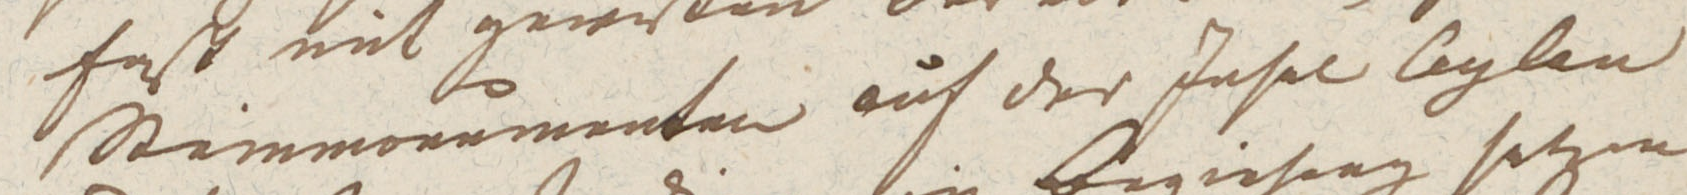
Steinmonumenten auf der Insel Ceylon
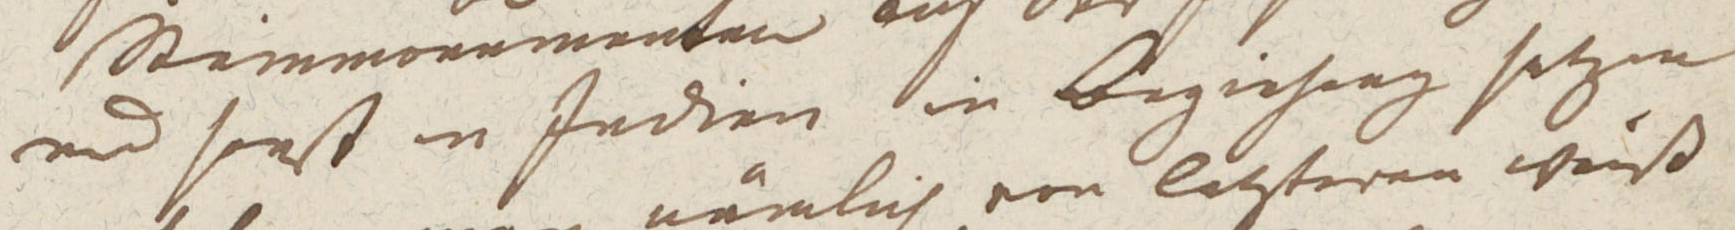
und sonst in Indien in Beziehung setzen
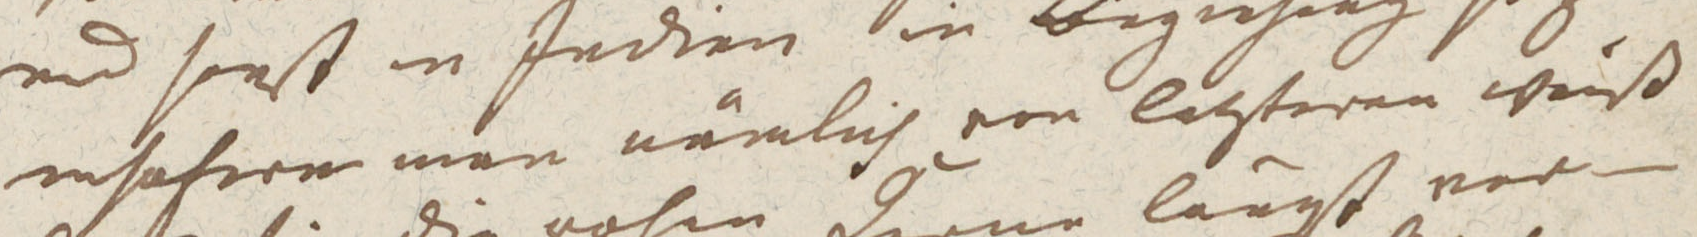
insofern man nämlich von letzeren weiss
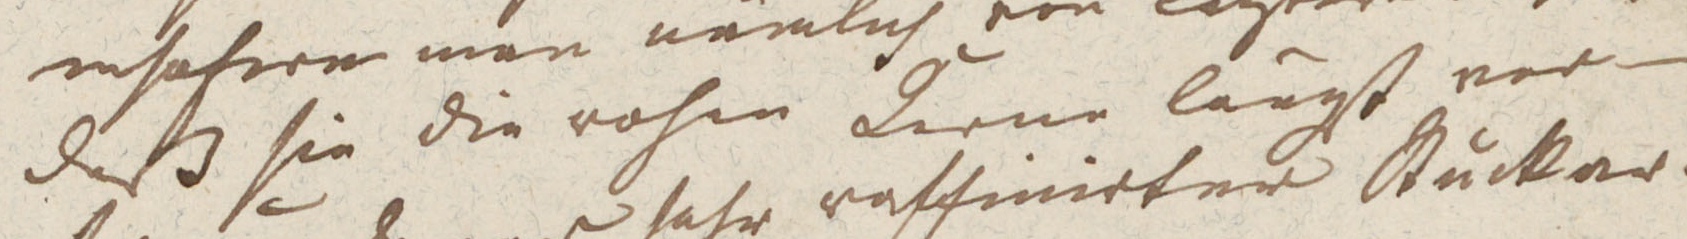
dass sie die rohen Kerne längst ver-
